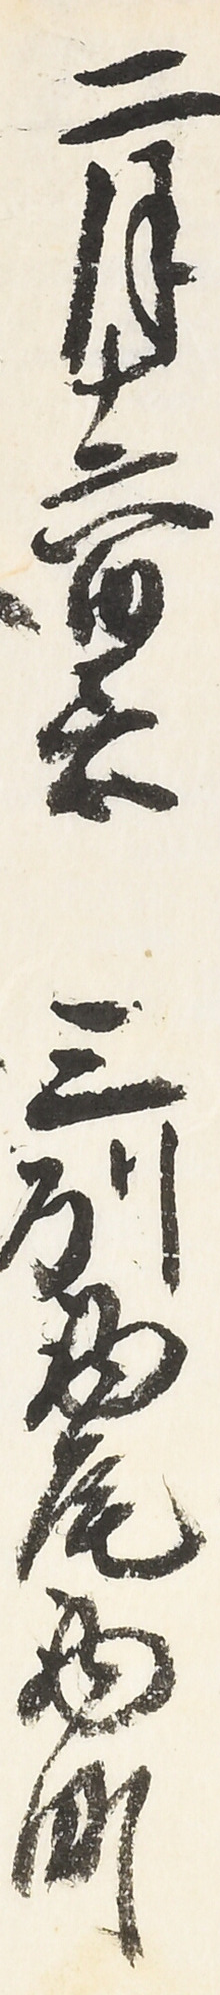二月十六日着三州西尾西町
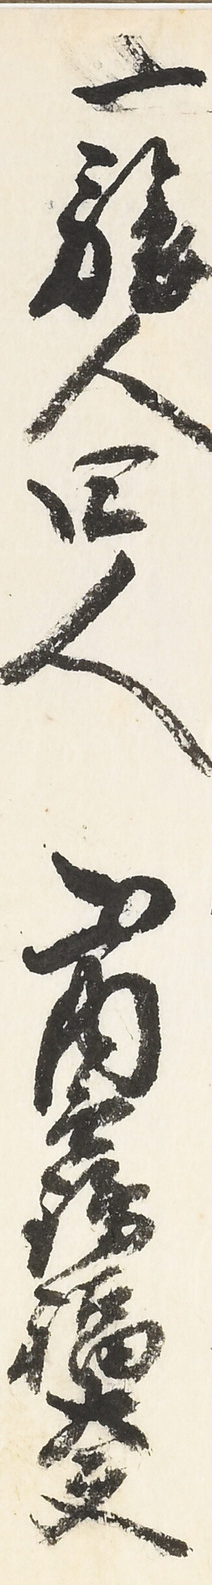一旅人四人山内靏福大夫
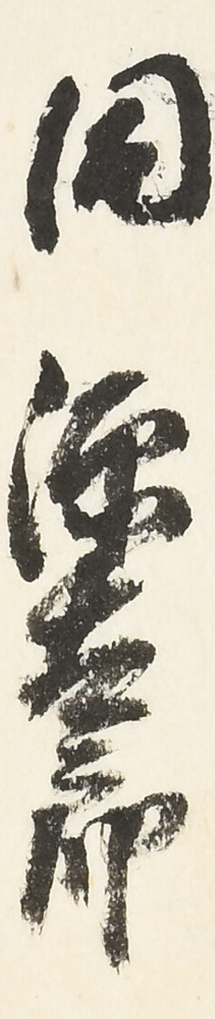同源太郎
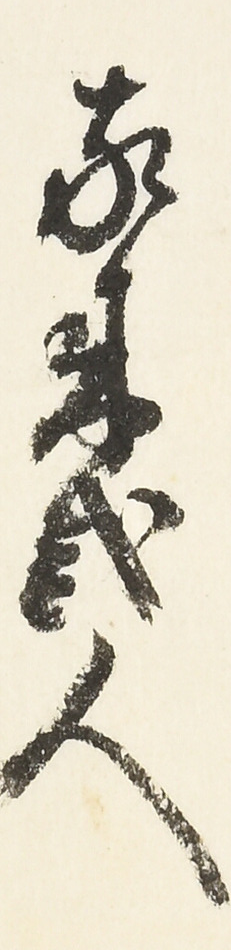家来弐人
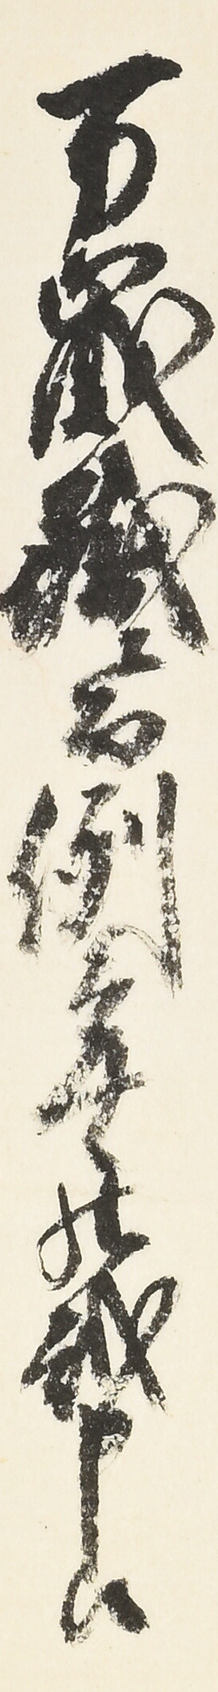万歳職ニ而例年罷越申候
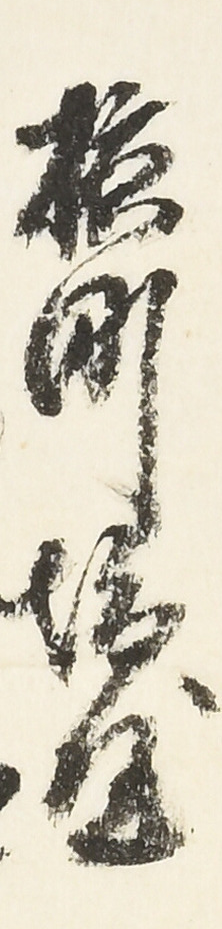横町塩屋
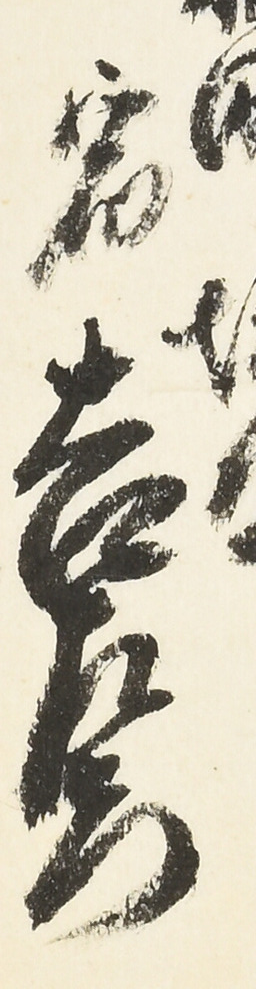宿吉左衛門
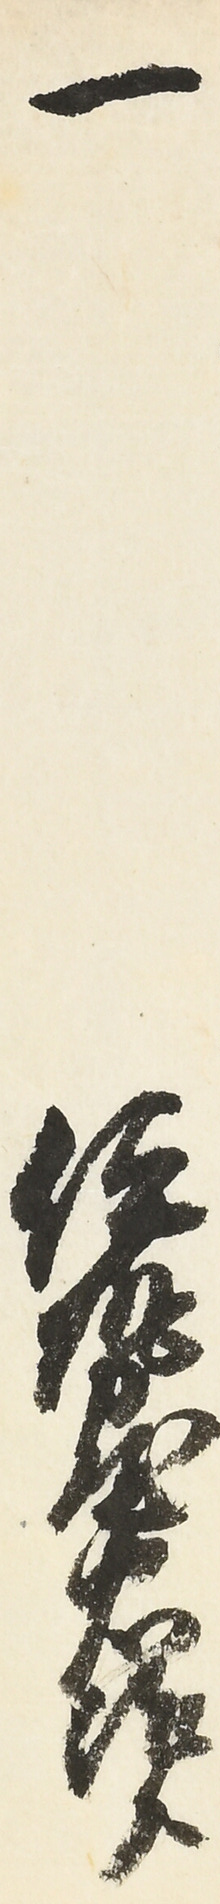一伊勢屋忠治郎
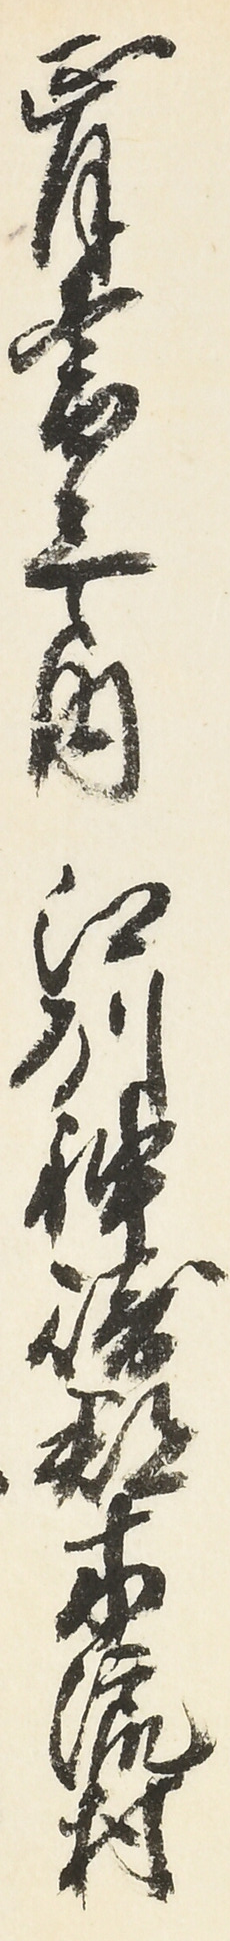正月書上之内江州神崎郡木流村
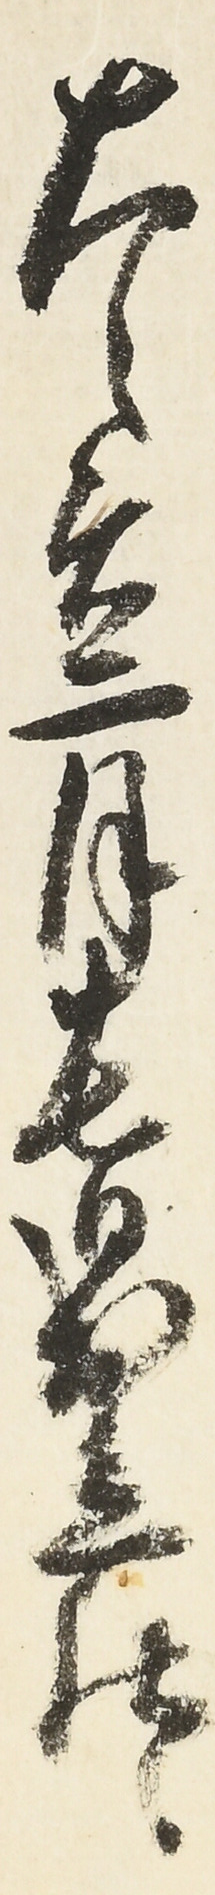右之者二月十七日出立仕候

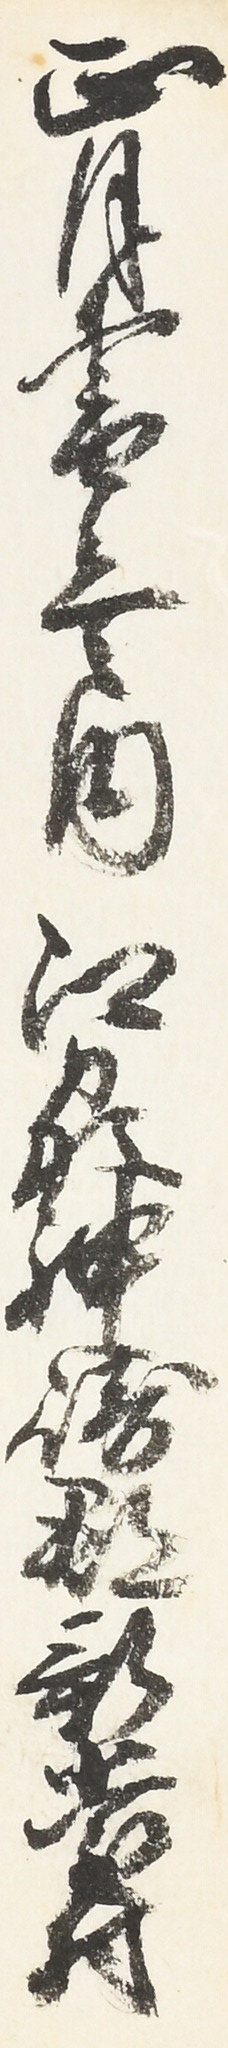正月書上之内江州神崎郡新堂村
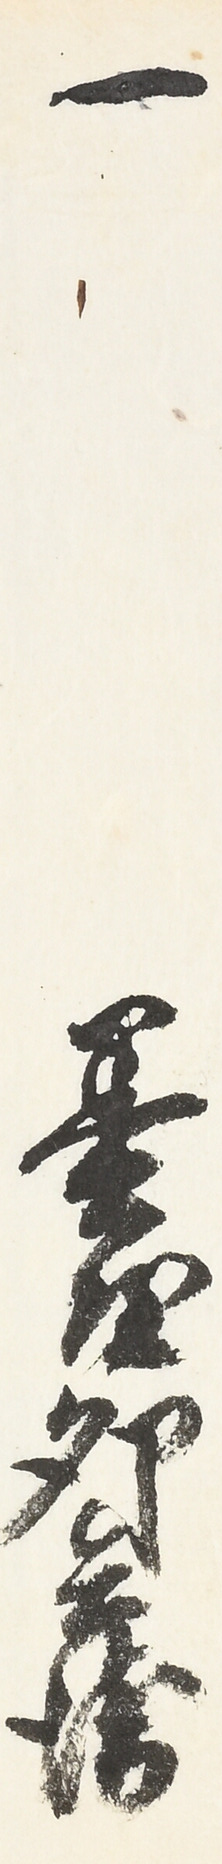一墨屋卯兵衛
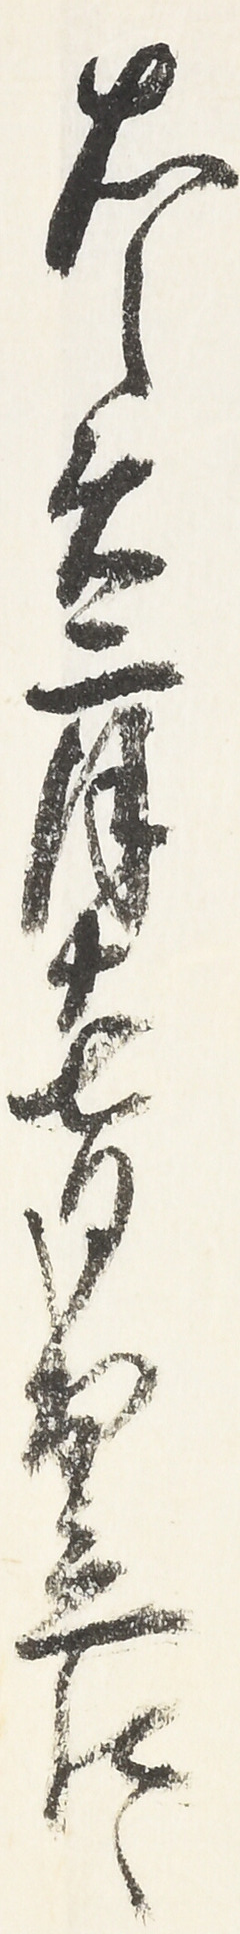右之者二月十七日出立仕候
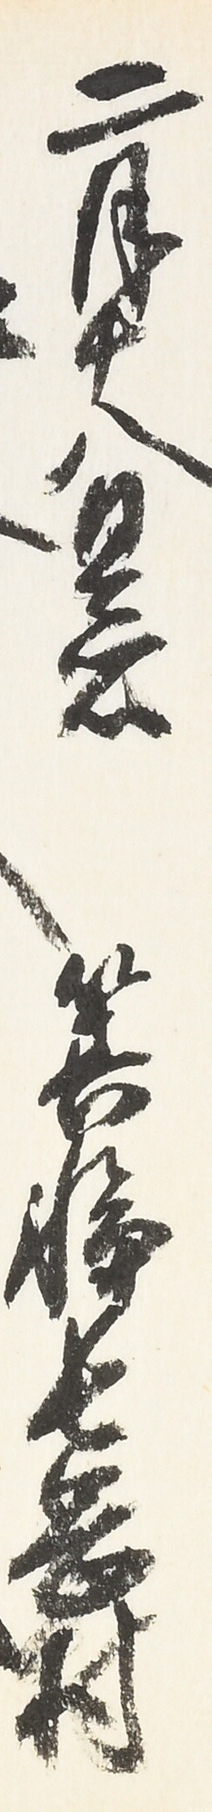二月十八日着箕輪長岡村
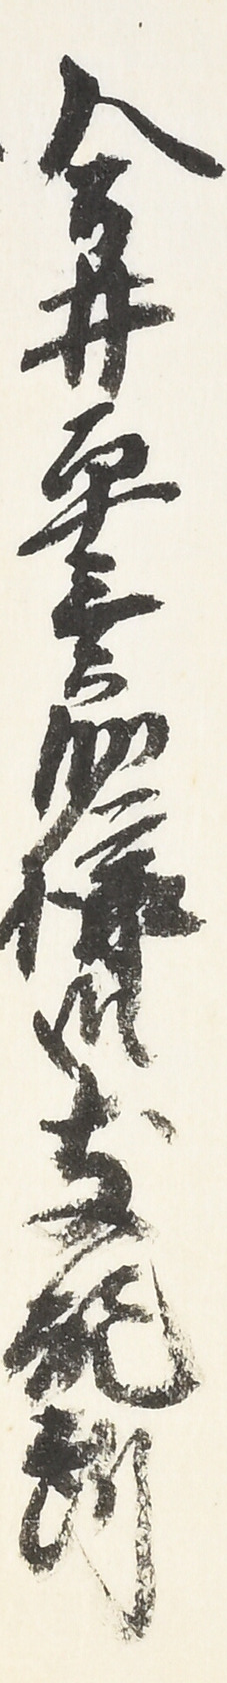今井平三郎様御支配所
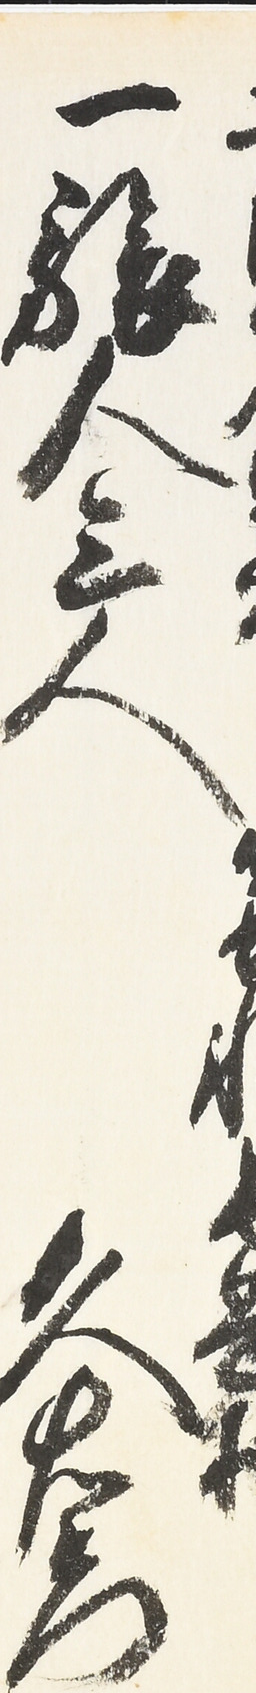一旅人三人久右衛門
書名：町中旅人泊控帳
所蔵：伊那市立高遠町図書館・合同会社AMANE
